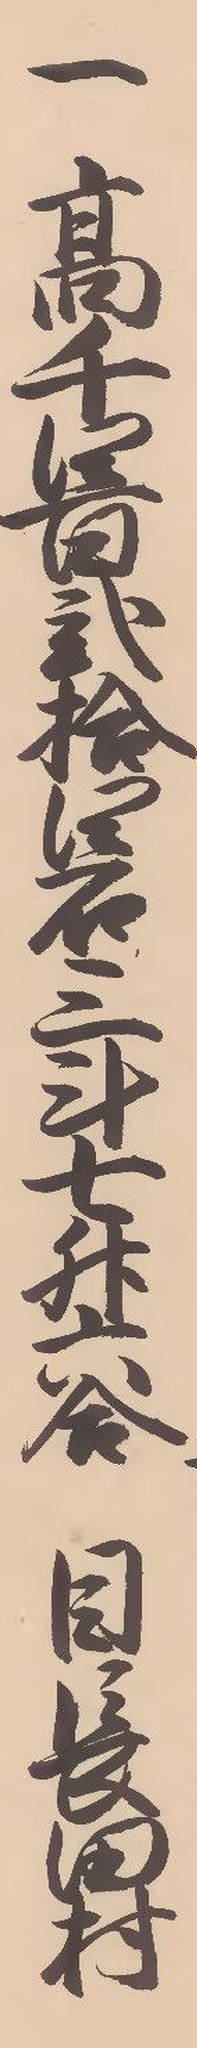一高千四百弐拾四石三斗七升六合目長田村
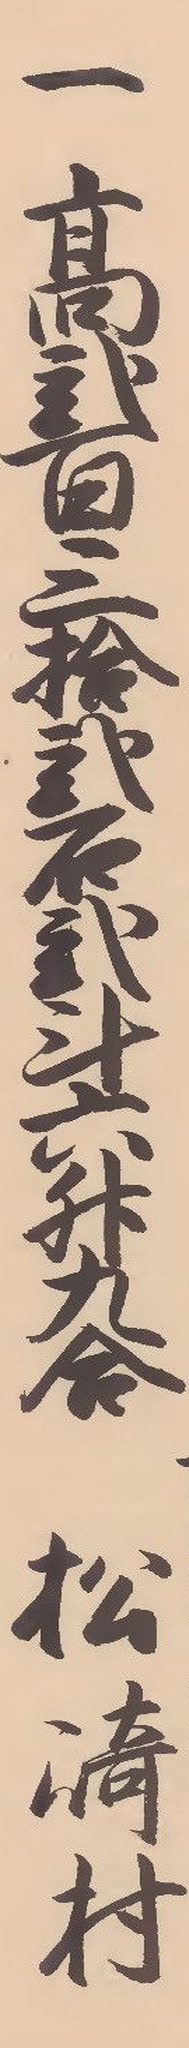一高弐百三拾弐石弐斗六升九合松崎村
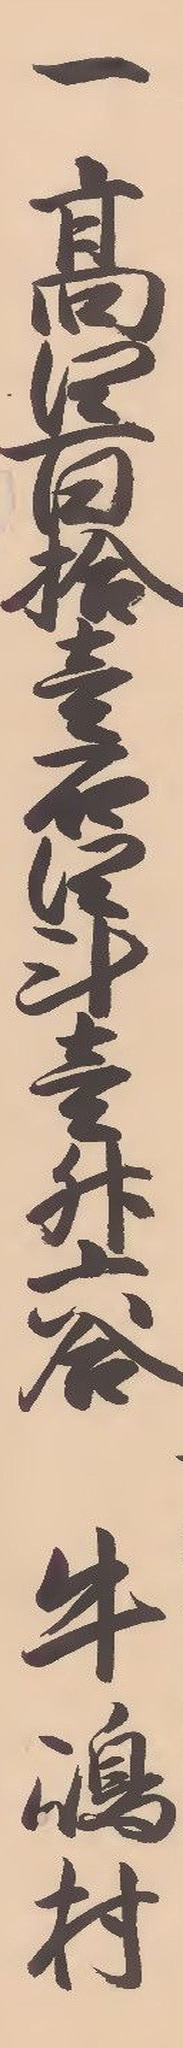一高四百拾壱石四斗壱升六合牛島村
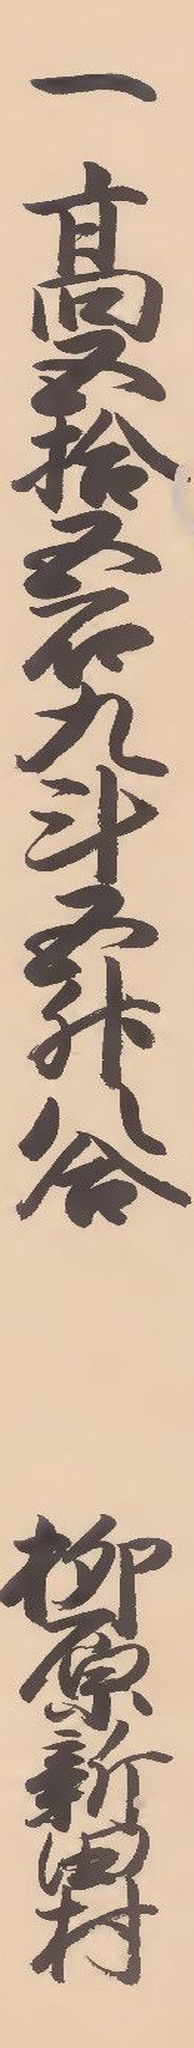一高五拾五石九斗五升八合柳原新田村
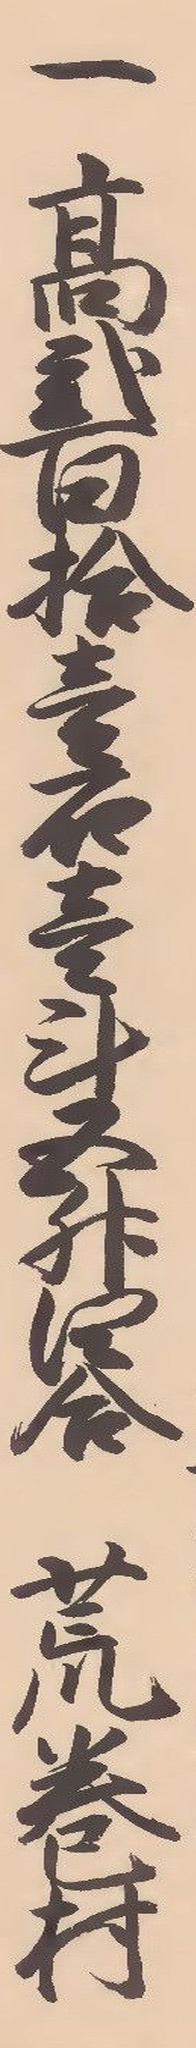一高弐百拾壱石壱斗五升四合荒巻村
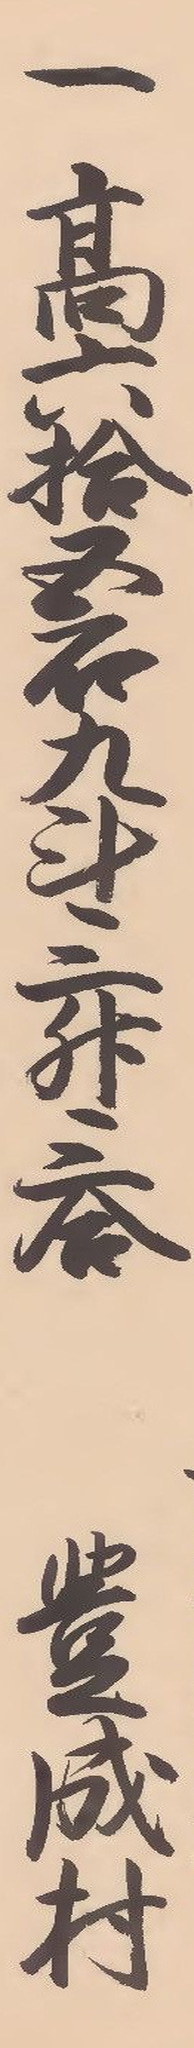一高六拾五石九斗三升三合豊成村
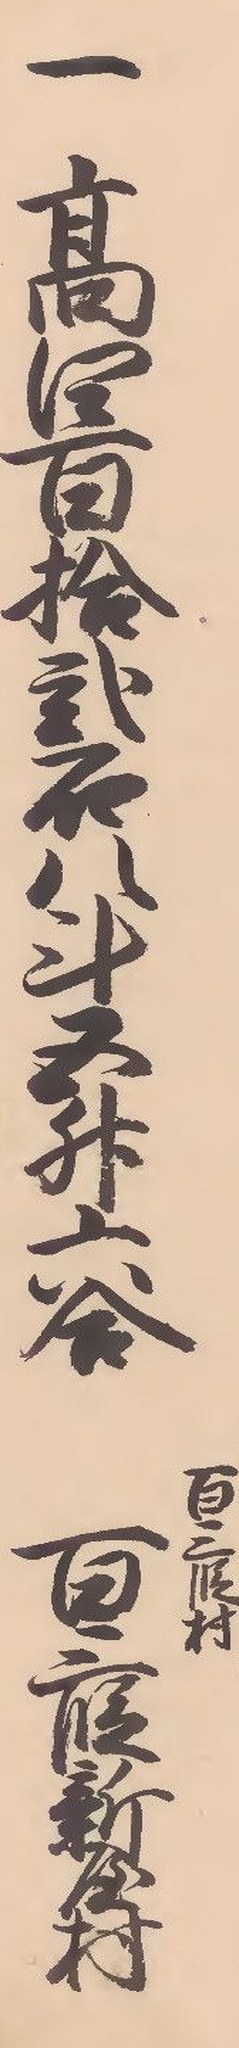一高四百拾弐石八斗五升六合百三段新屋村

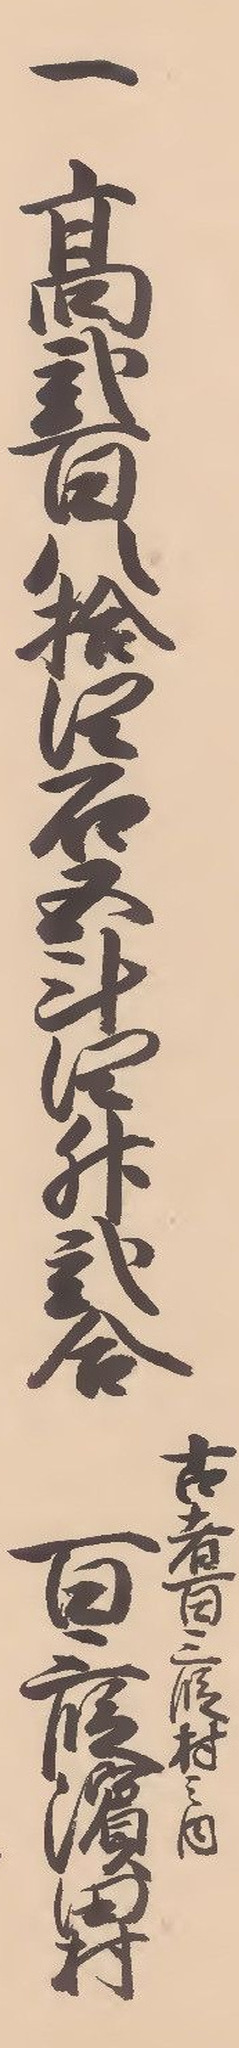一高弐百八拾四石五斗四升弐合百三段浜田村
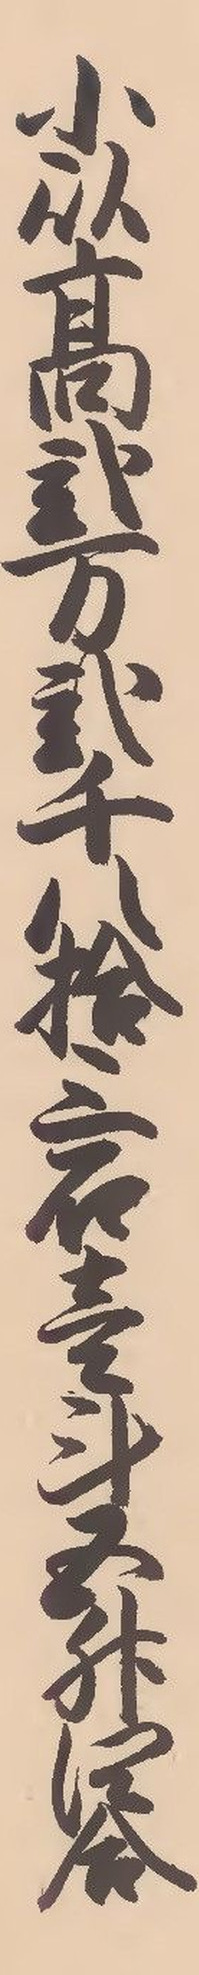小以高弐万弐千八拾三石壱斗五升四合
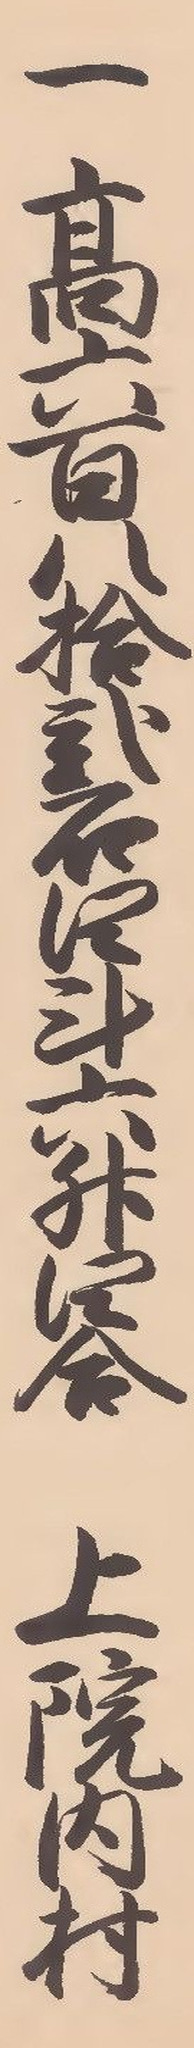一高六百八拾弐石四斗六升四合上院内村
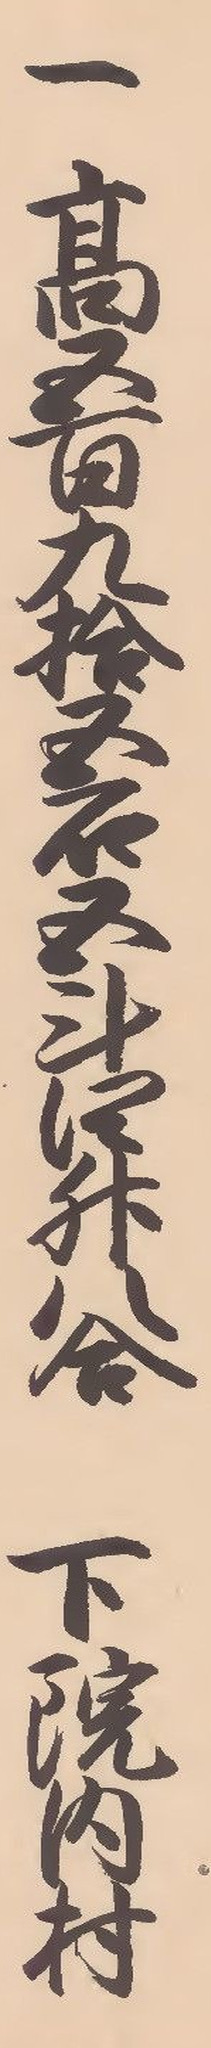一高五百九拾五石五斗四升八合下院内村
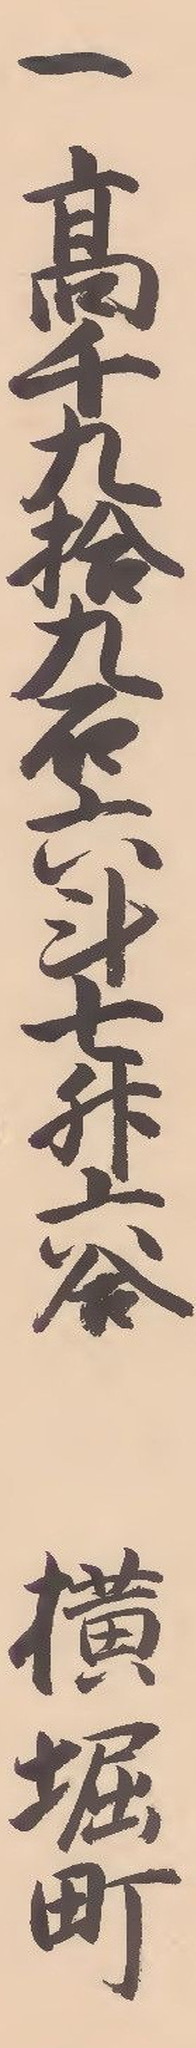一高千九拾九石六斗七升六合横堀町

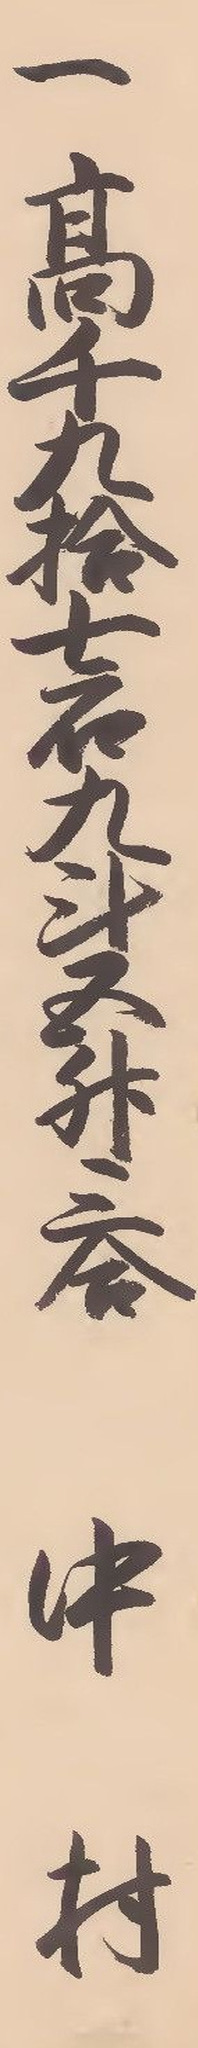一高千九拾七石九斗五升三合中村
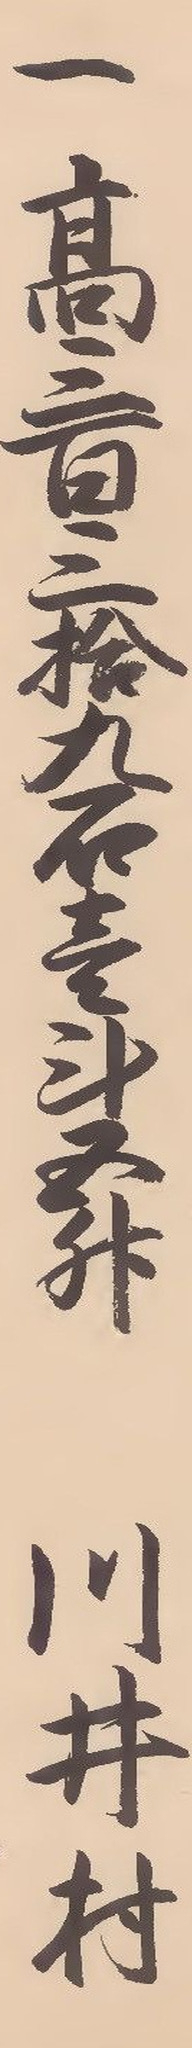一高三百三拾九石壱斗五升川井村
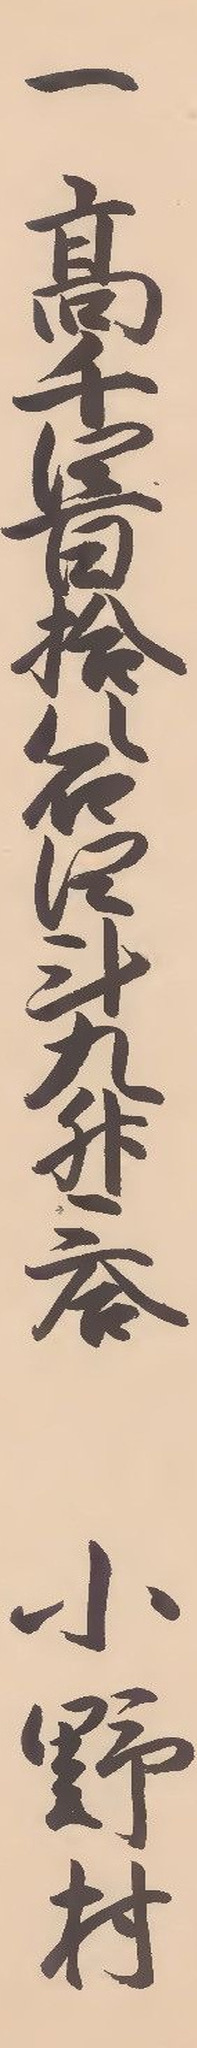一高千四百拾八石四斗九升三合小野村
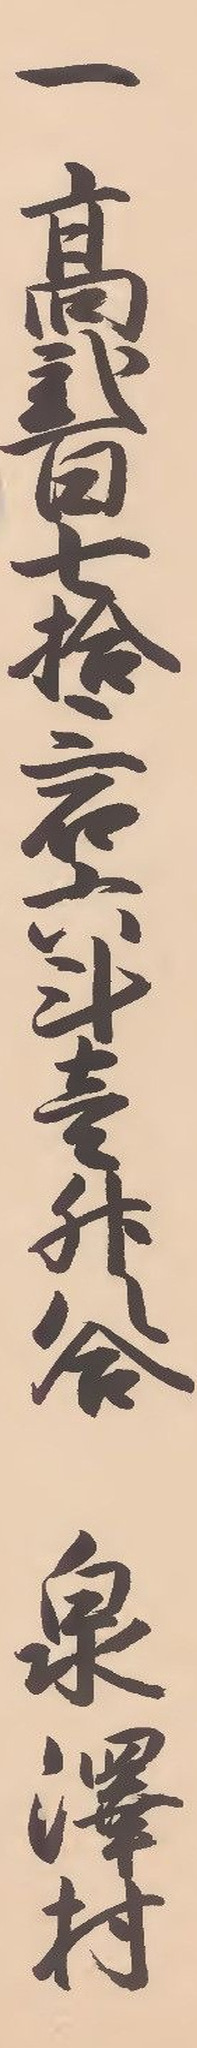一高弐百七拾三石六斗壱升八合泉沢村
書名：出羽国郷帳　５
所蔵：国立公文書館 National Archives of Japan
